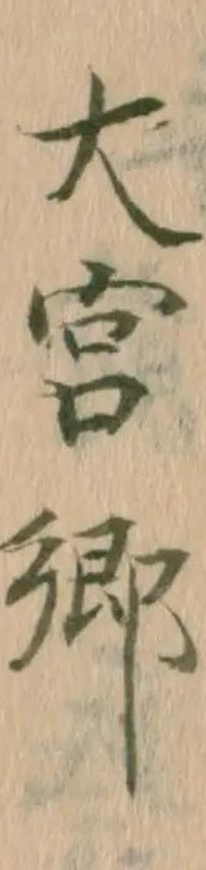大宮郷
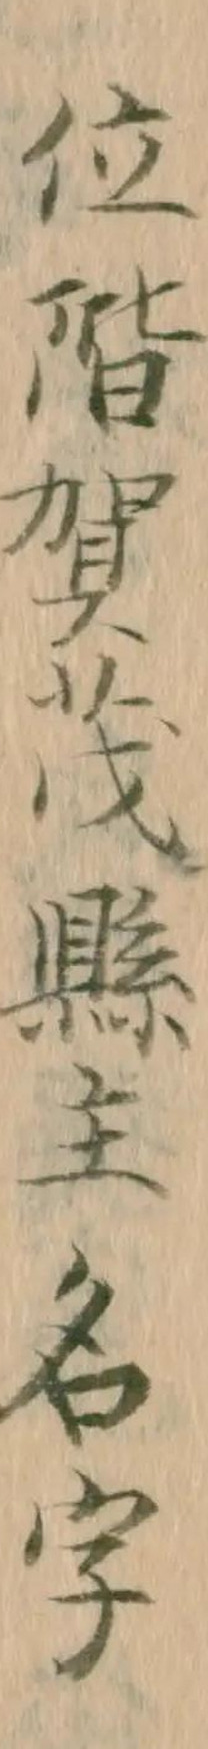位階賀茂県主名字
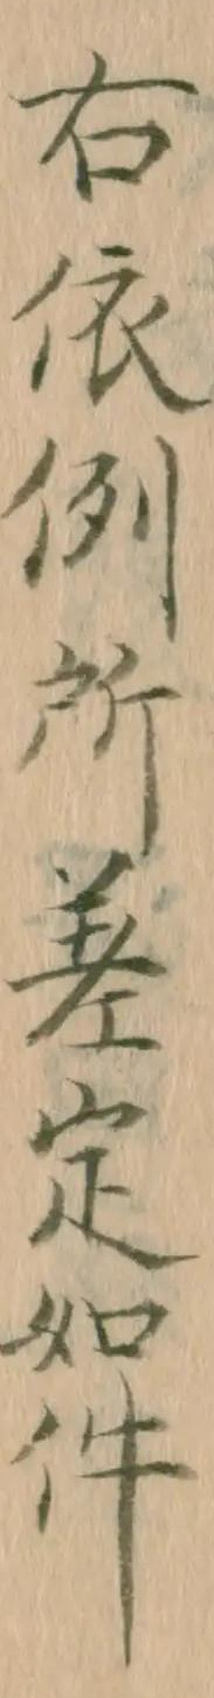右依例所差定如件
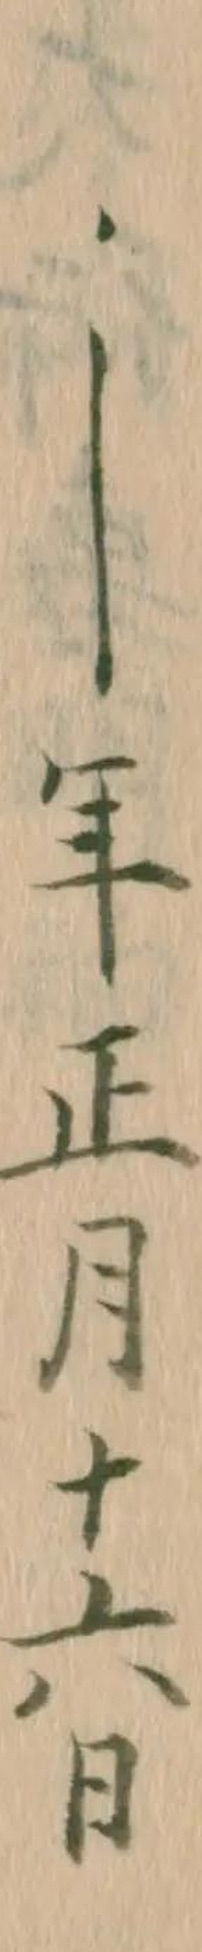――年正月十六日
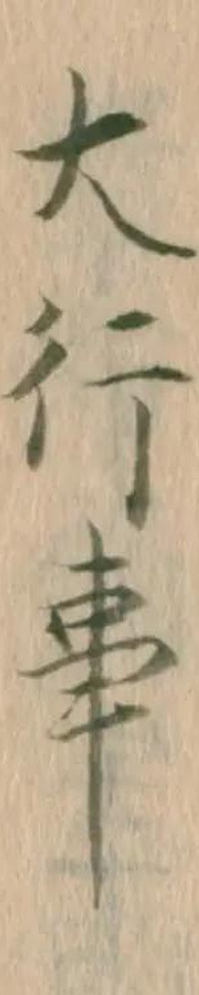大行事
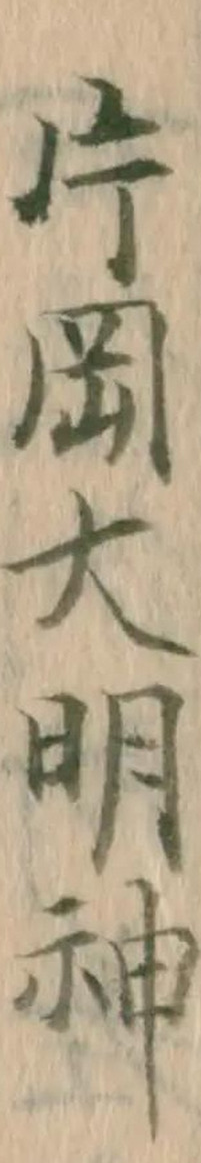片岡大明神
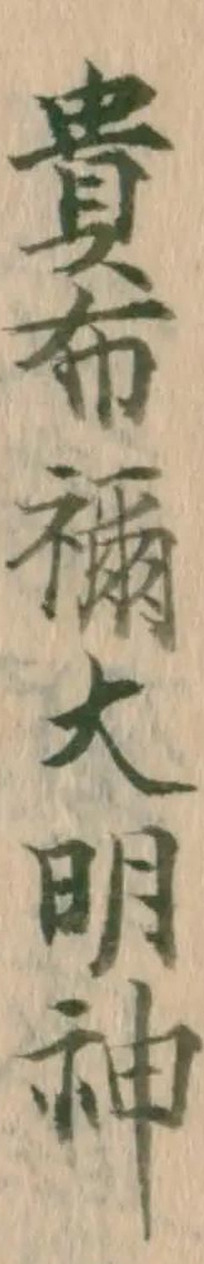貴布祢大明神
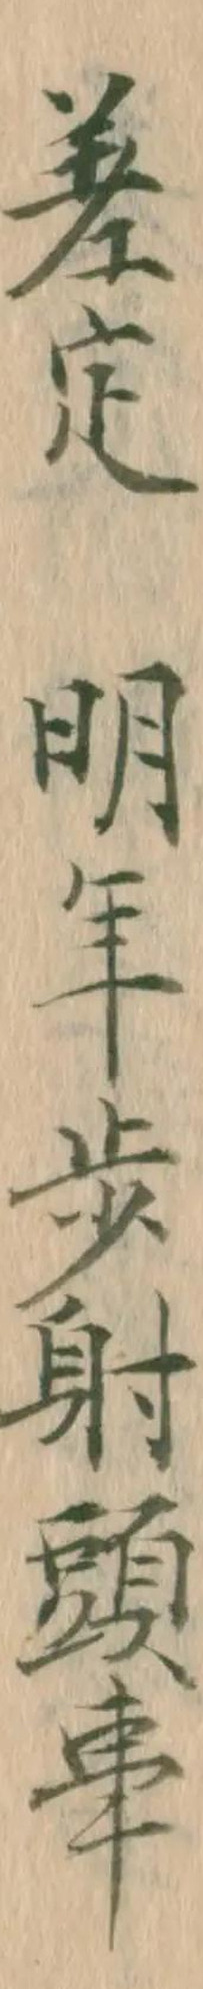差定明年歩射頭事
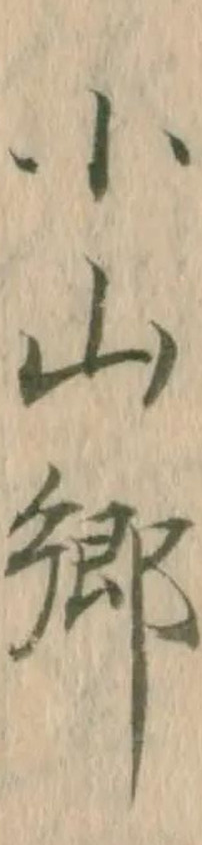小山郷
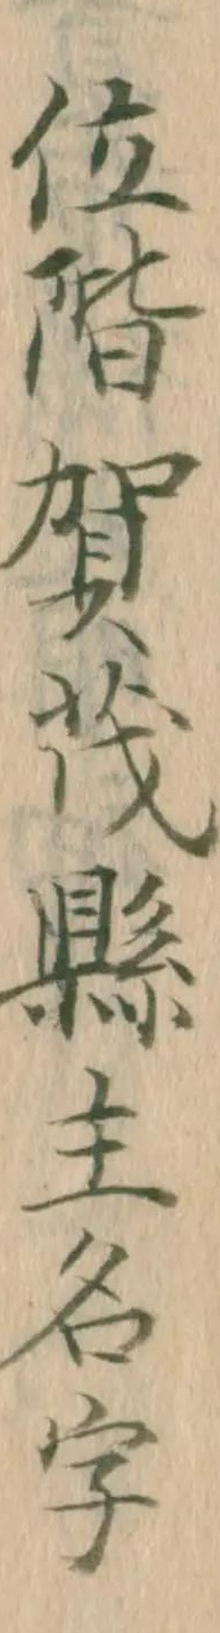位階賀茂県主名字
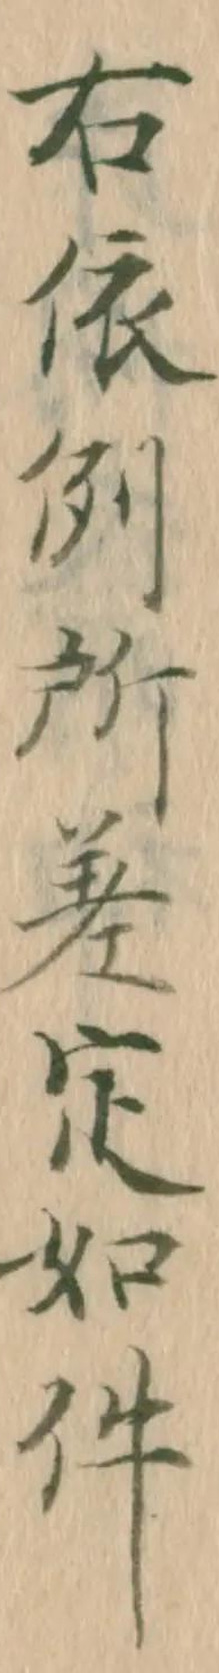右依例所差定如件
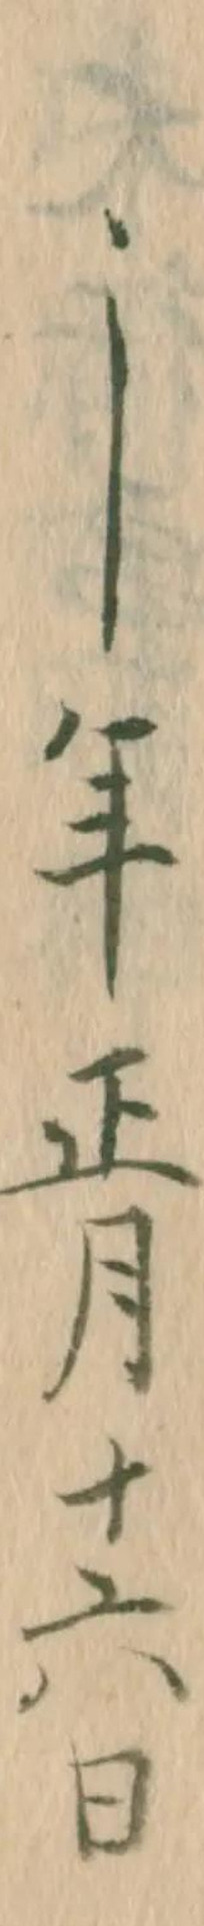――年正月十六日

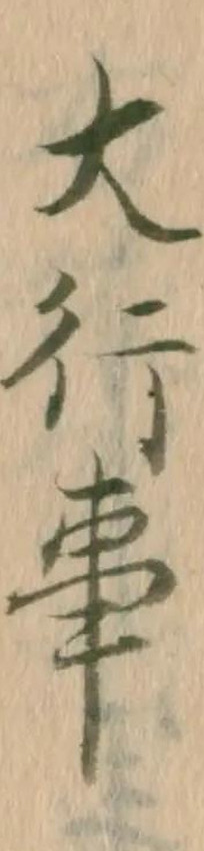大行事
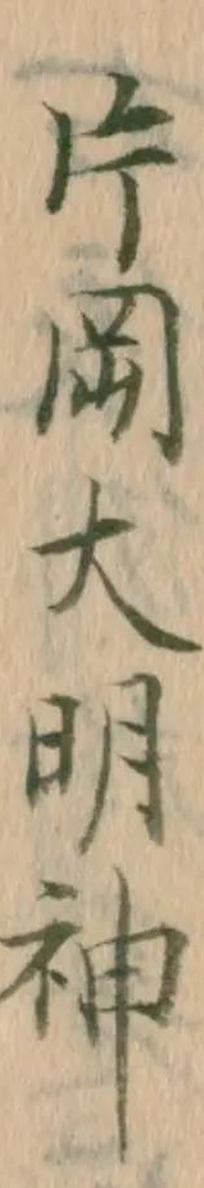片岡大明神
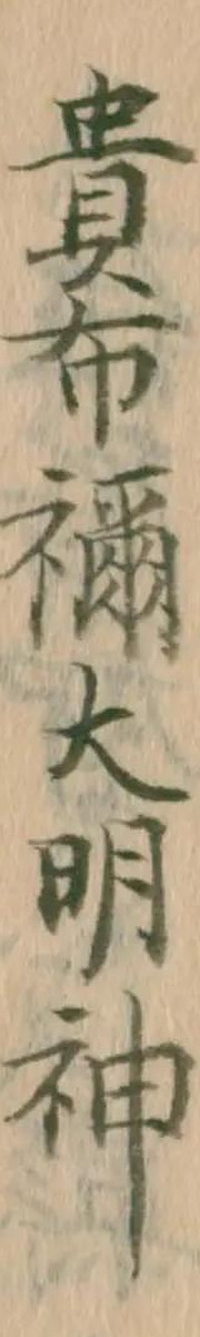貴布祢大明神
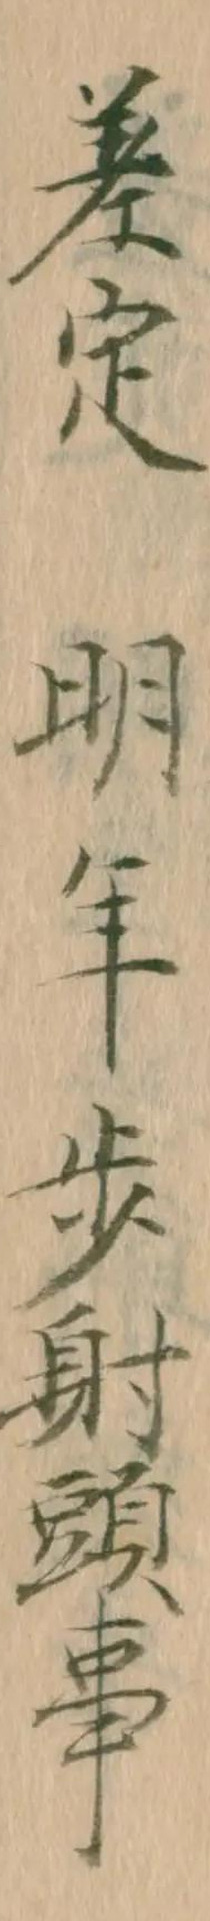差定明年歩射頭事
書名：賀茂社記録. 第26冊
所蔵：国立国会図書館 National Diet Library, JAPAN
